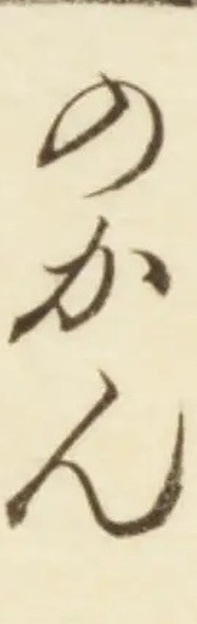のかん

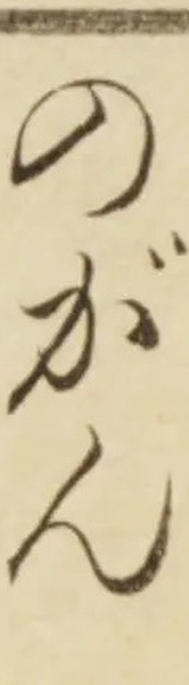のがん
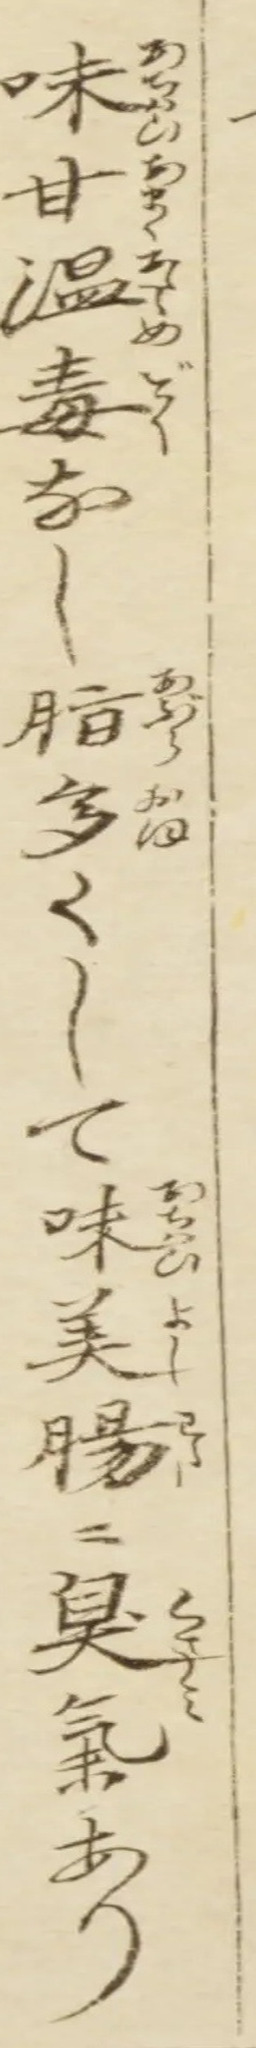味甘温毒なし脂多くして味美腸に臭気あり
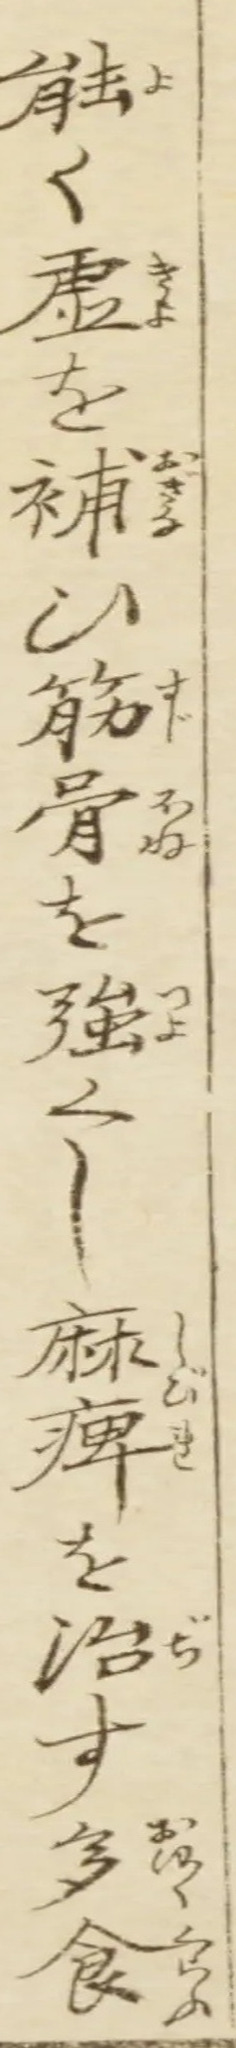能く虚を補ひ筋骨を強くし麻痺を治す多食
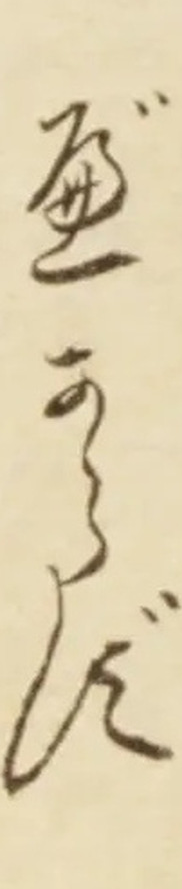べからず
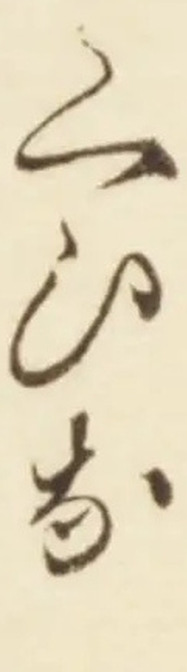くひな

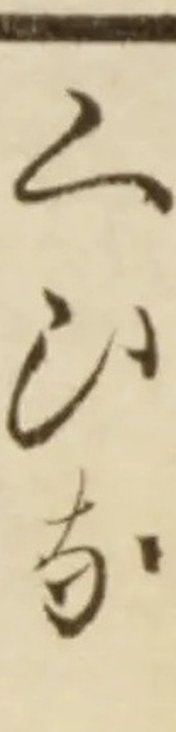くひな
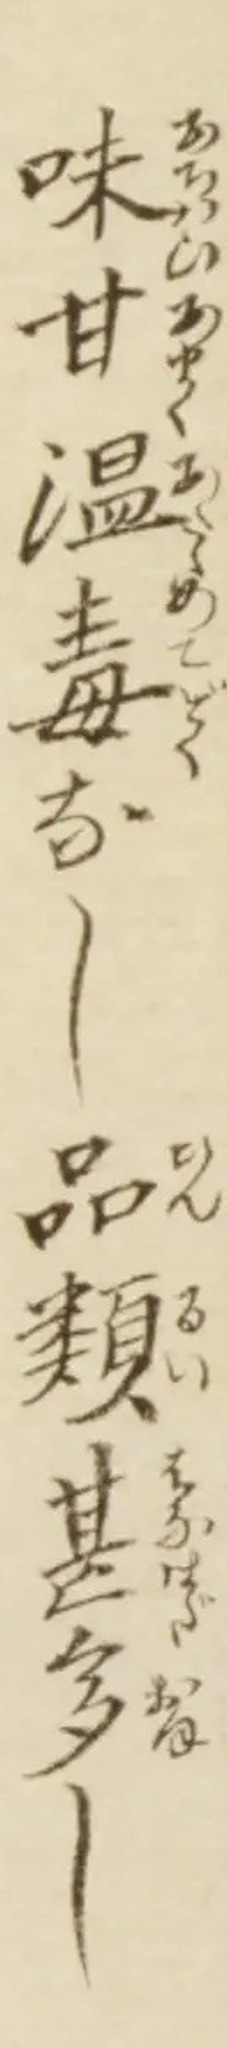味甘温毒なし品類甚多し
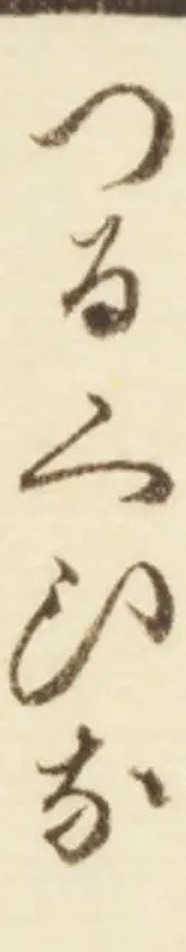つるくひな

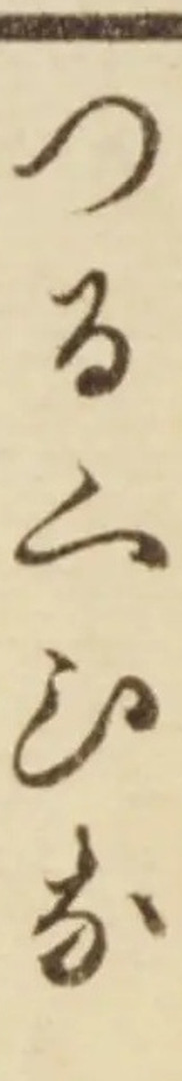つるくひな
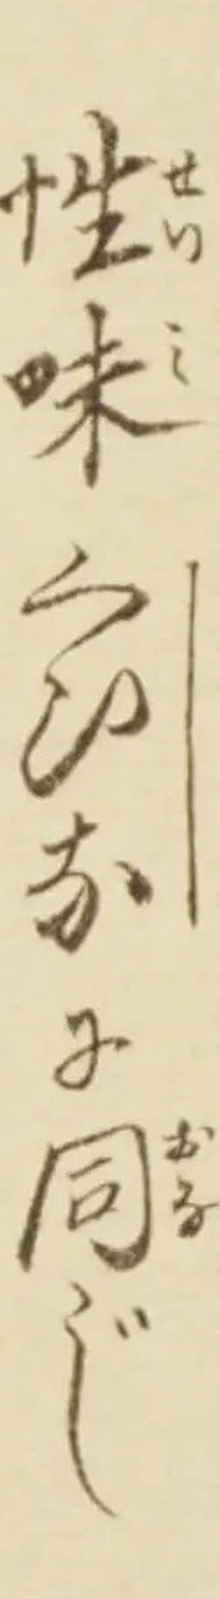性味くひなに同じ
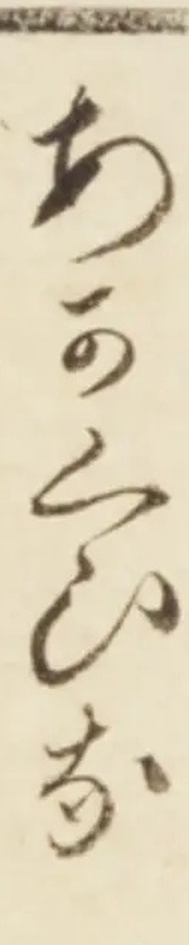あかくひな

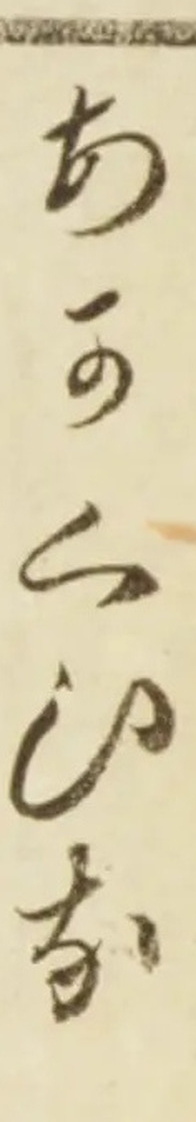あかくひな
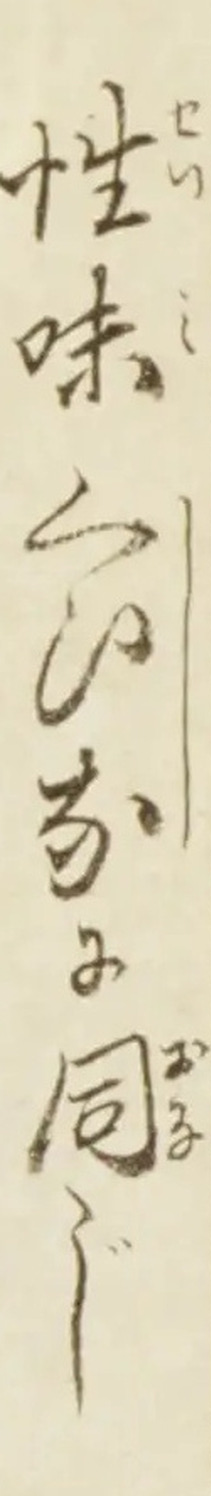性味くひなに同じ
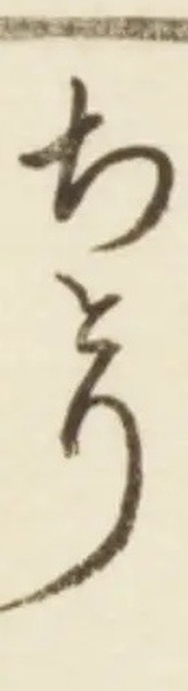ちとり

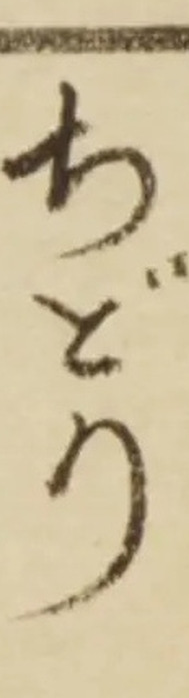ちどり
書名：華鳥譜
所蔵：国立国会図書館 National Diet Library, JAPAN
